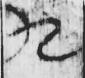九
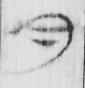月
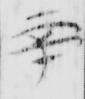辛
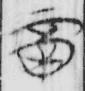梄（酉）
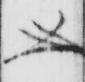之
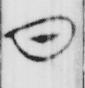日
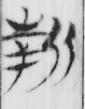新
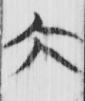大
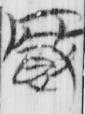○（厩）
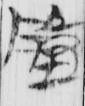○（陳）
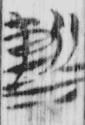漸
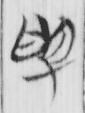受
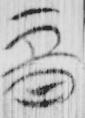○（期）
